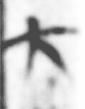大
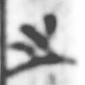之
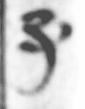子（牸）
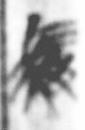亡？
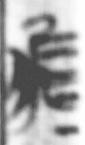飛（騑）
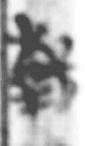新（新）
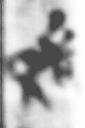○（造）
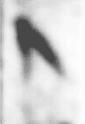人
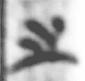之
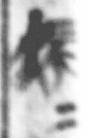六
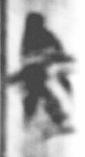墨
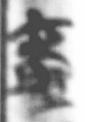𨍱（乘）
